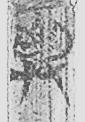與
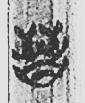晉
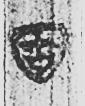固
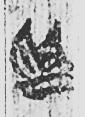爲
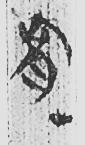{占肉}
